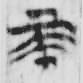而
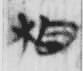相
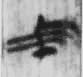与（與）
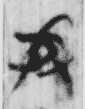弃
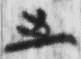之
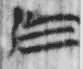於
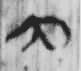大
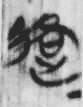○（路）
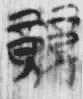競
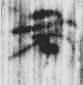不
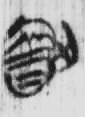割
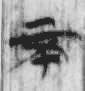不
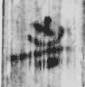至
